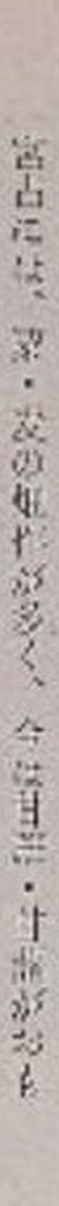宮古には、粱・麦の畑作が多く、今は甘蔗・甘藷がおも
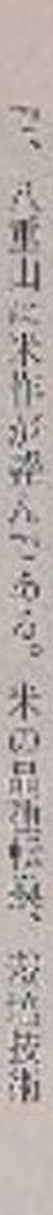で、八重山に米作が盛んである。米の品種転換、栽培技術
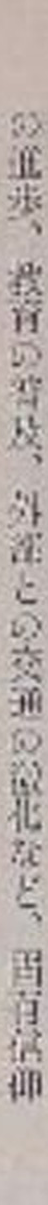の進歩、教育の普及、外部との交通の激化など、固有信仰
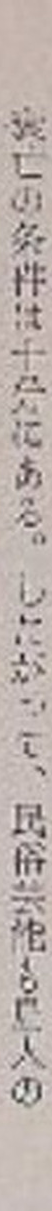衰亡の条件は十分にある。したがって、民俗芸能も島人の
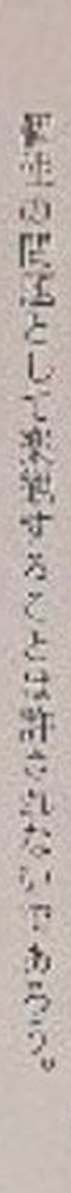個性の問題として楽観することは許されないであろう。
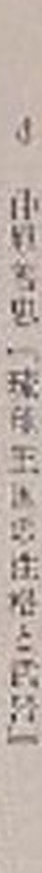４仲原善忠『琉球王国の性格と武器』
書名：沖縄固有信仰のおとろえ
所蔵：University of the Ryukyus Library
